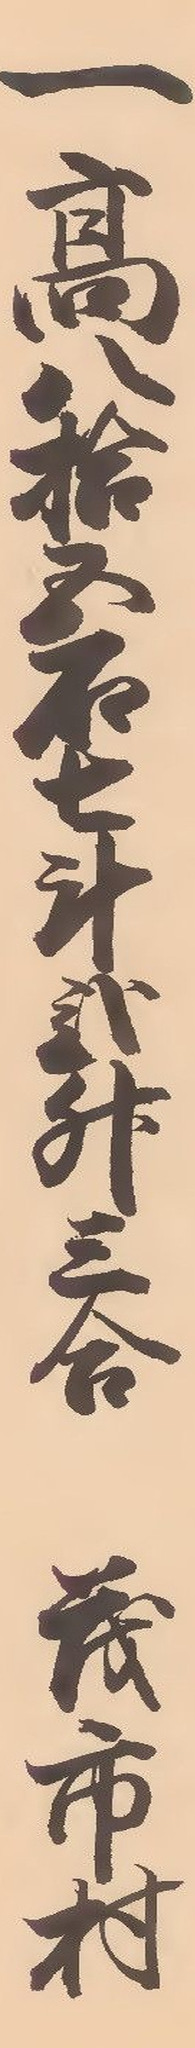一高八拾五石七斗弐升三合茂市村

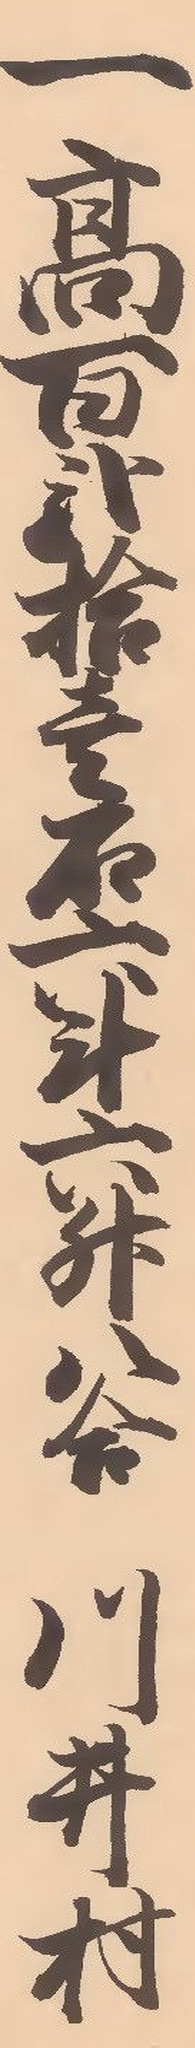一高百弐拾壱石六斗六升八合川井村
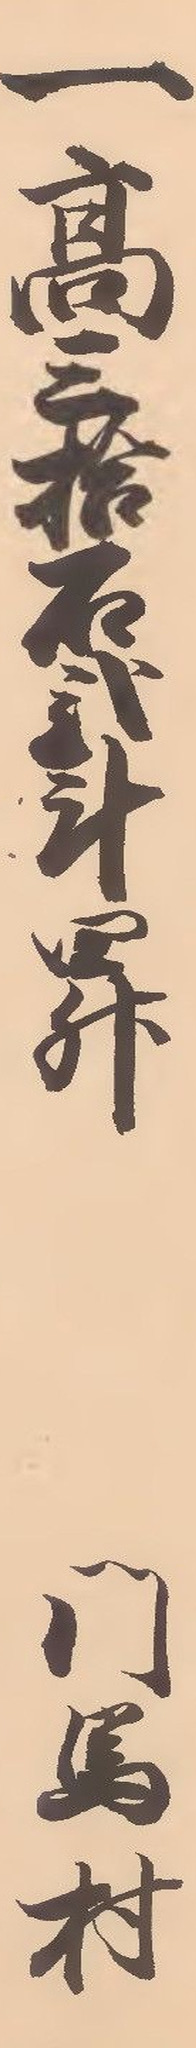一高三拾石弐斗四升門馬村
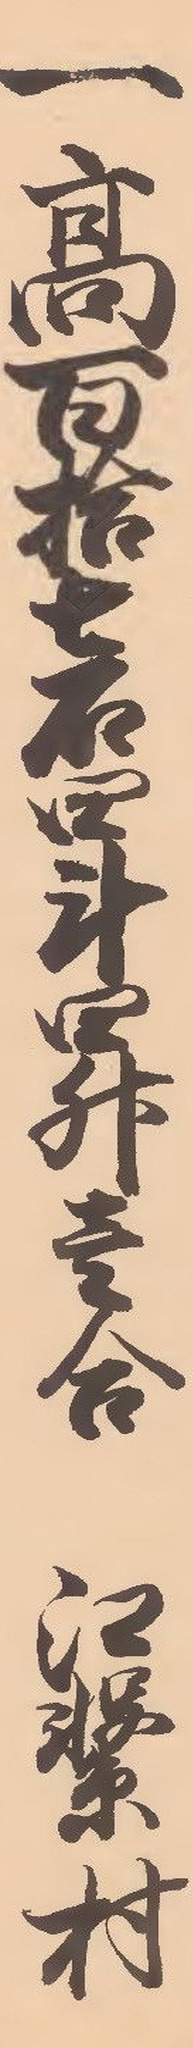一高百拾七石四斗四升壱合江繋村
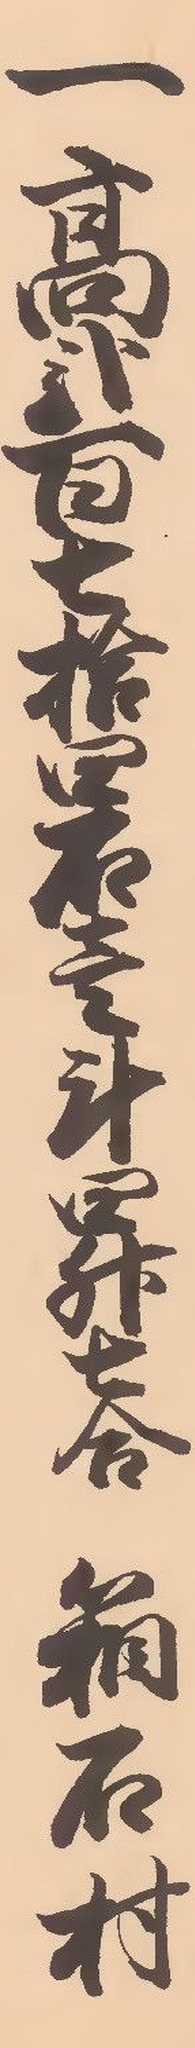一高弐百七拾四石壱斗四升七合箱石村
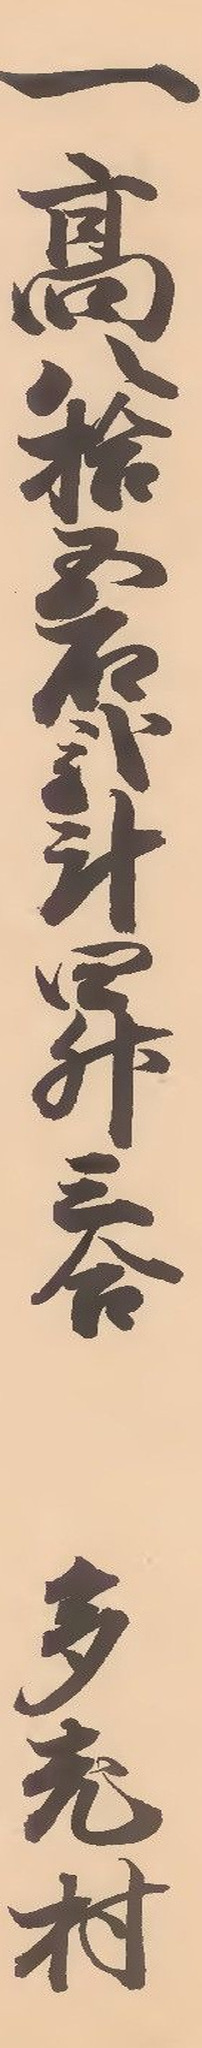一高八拾五石弐斗四升三合多老村
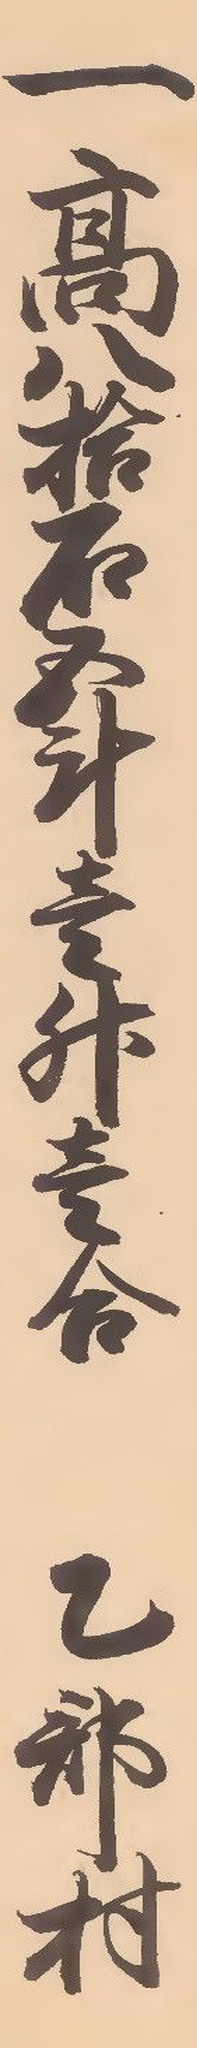一高八拾石五斗壱升壱合乙部村
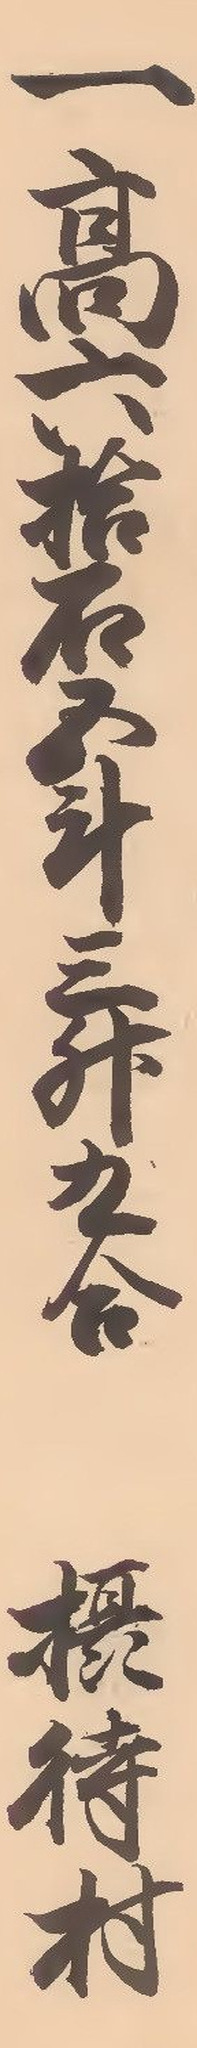一高六拾石五斗三升九合摂待村

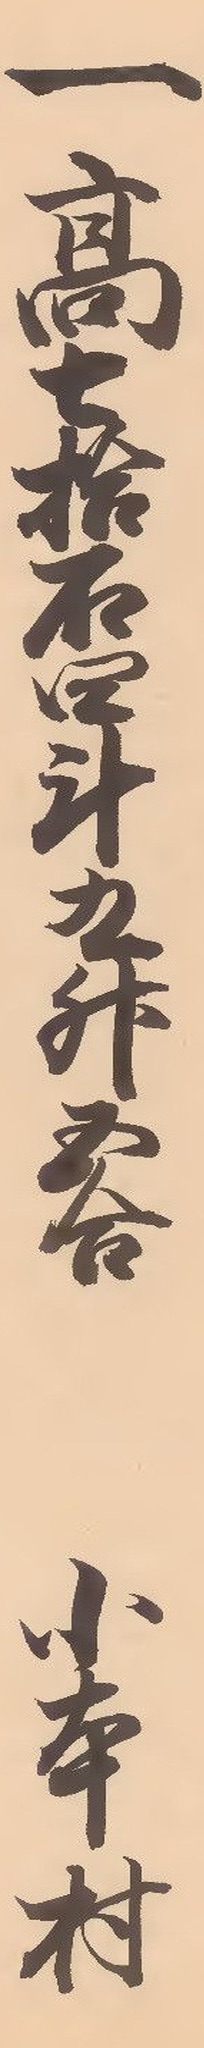一高七拾石四斗九升五合小本村
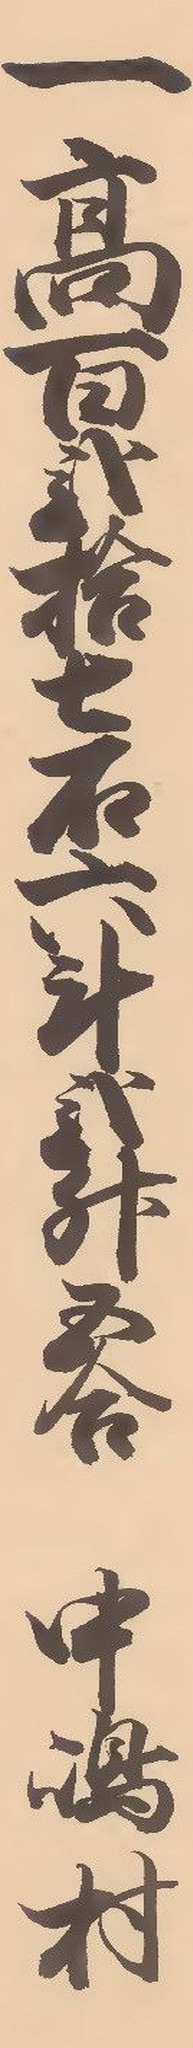一高百弐拾七石六斗弐升五合中島村
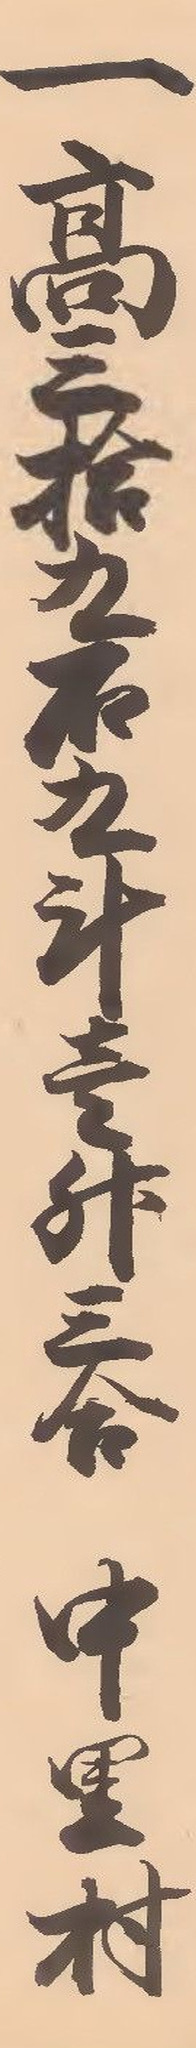一高三拾九石九斗壱升三合中里村
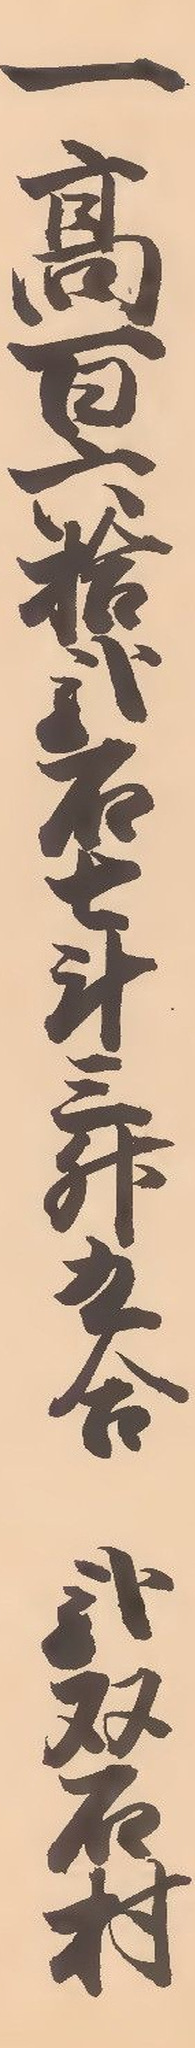一高百六拾弐石七斗三升九合弐双石村
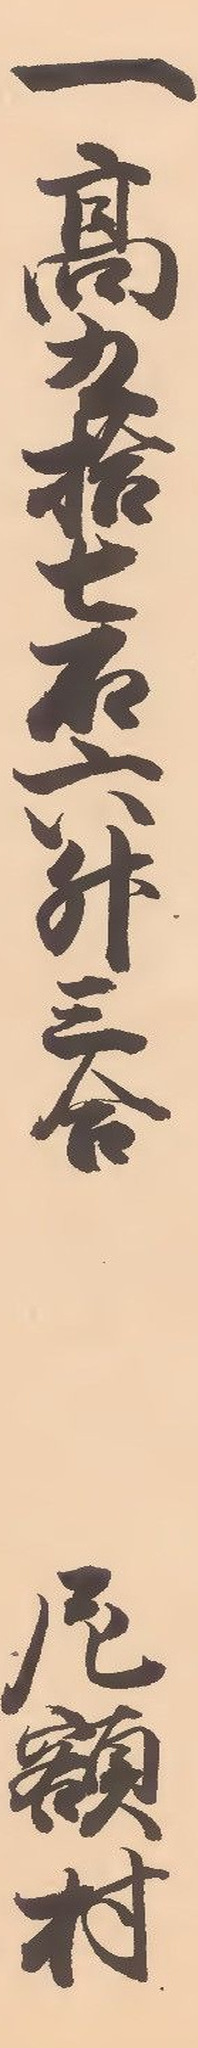一高九拾七石六升三合尼額村
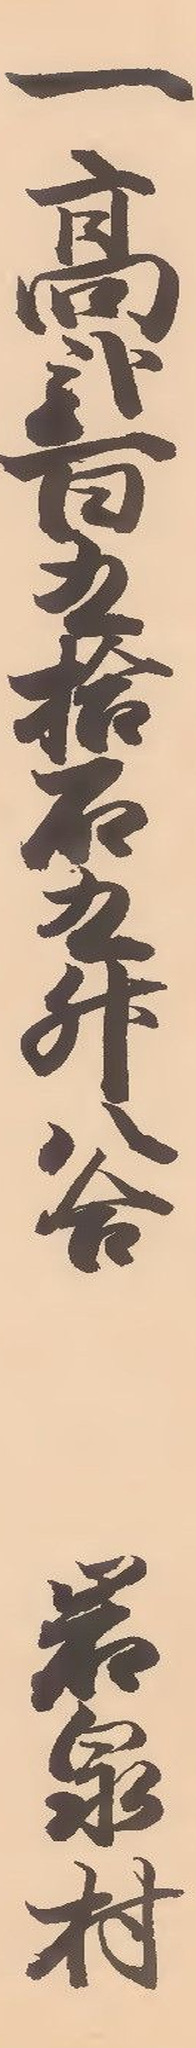一高弐百九拾石九升八合岩泉村
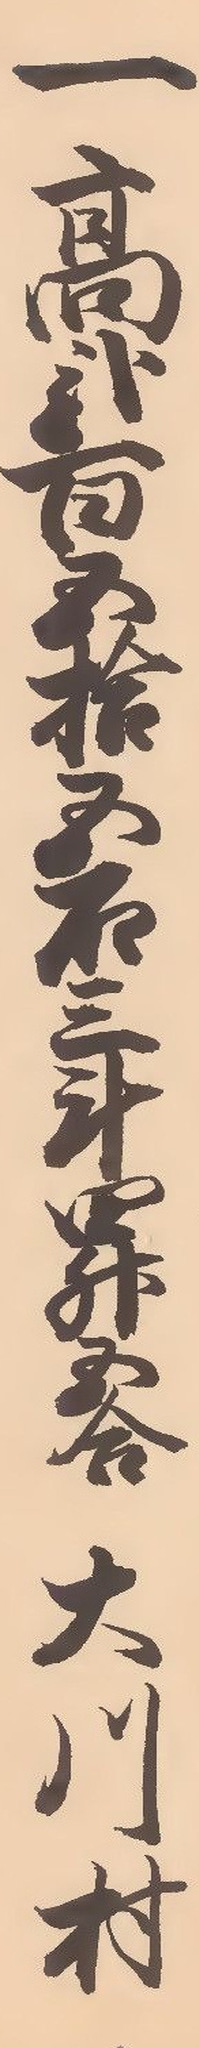一高弐百五拾五石三斗四升五合大川村
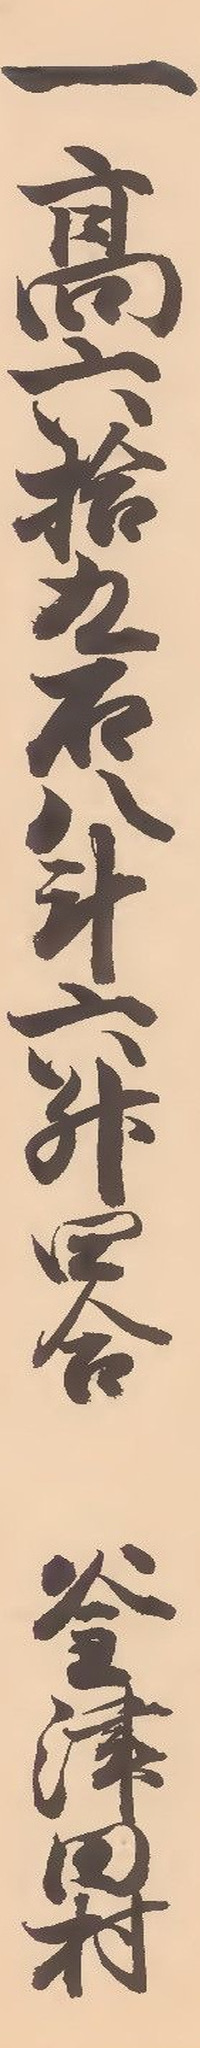一高六拾九石八斗六升四合釜津田村
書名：陸奥国郷帳　６
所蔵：国立公文書館 National Archives of Japan
